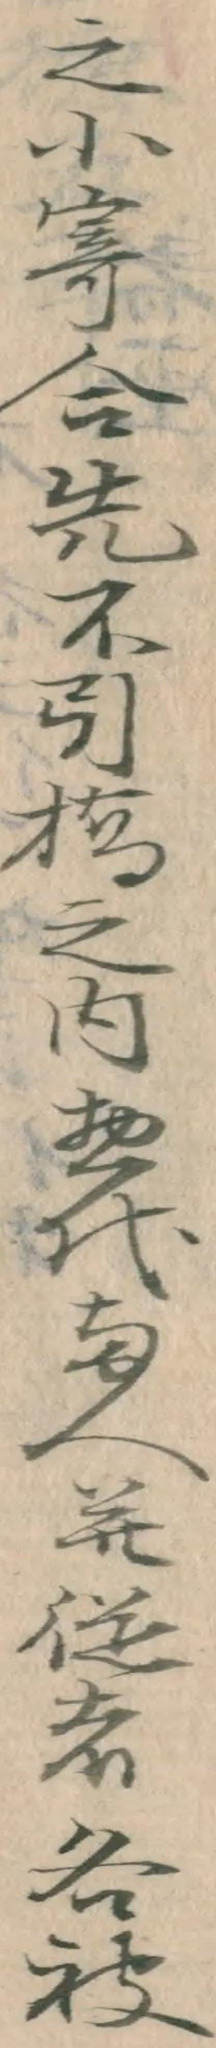之小寄合先不引橋之内惣代両人并従者各被
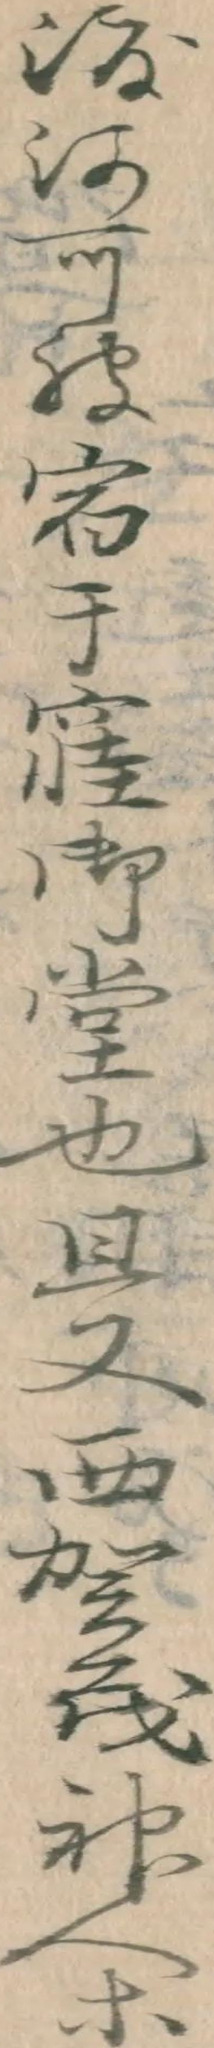渡河可被宿于窪御堂也且又西賀義神人等
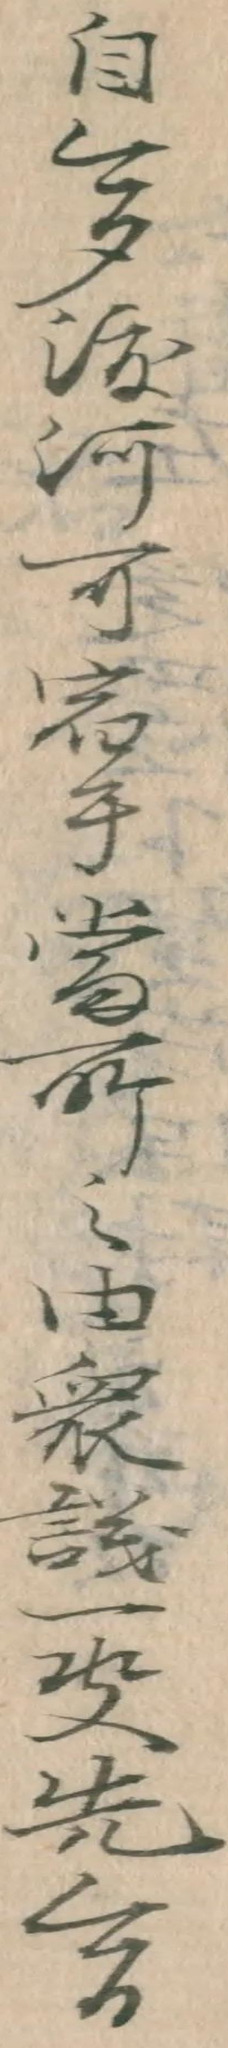自今夕渡河可宿手当所之由衆議一決先今日
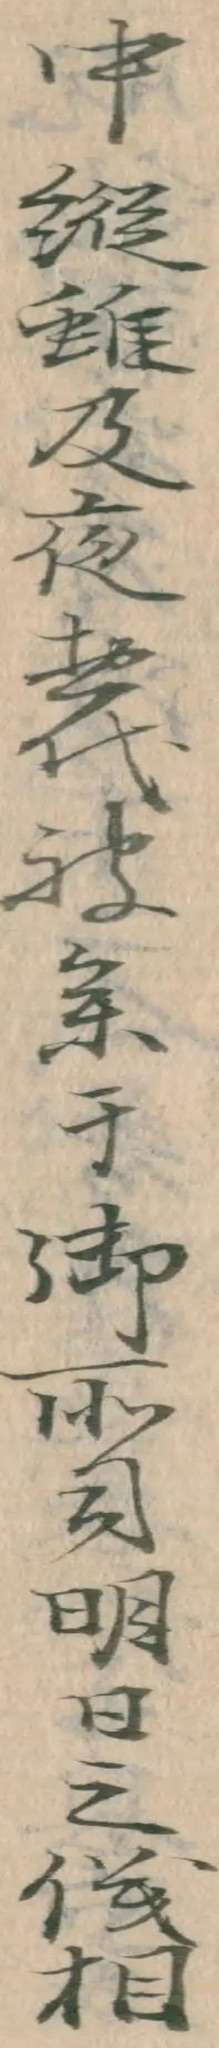中縦雖及夜惣代被参于御所司明日之儀相
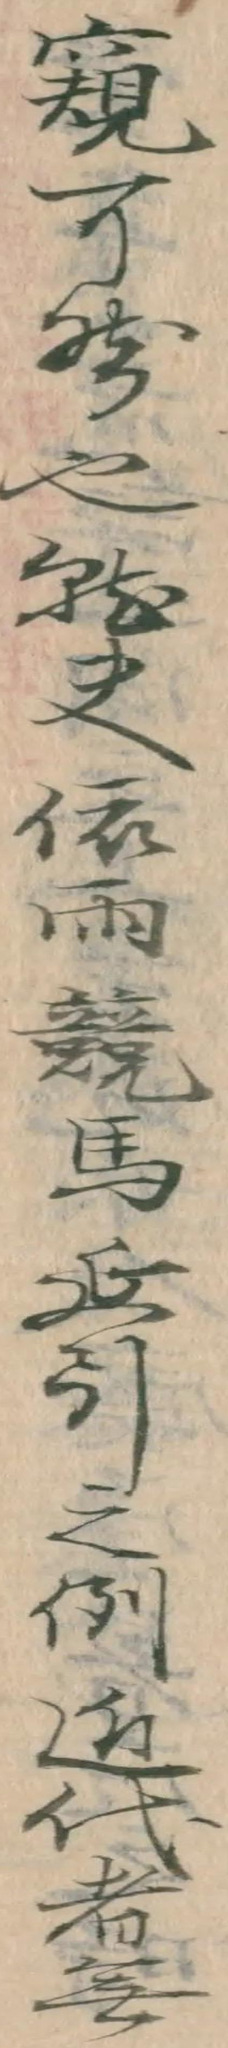窺可然也就夫依雨競馬延引之例近代者無
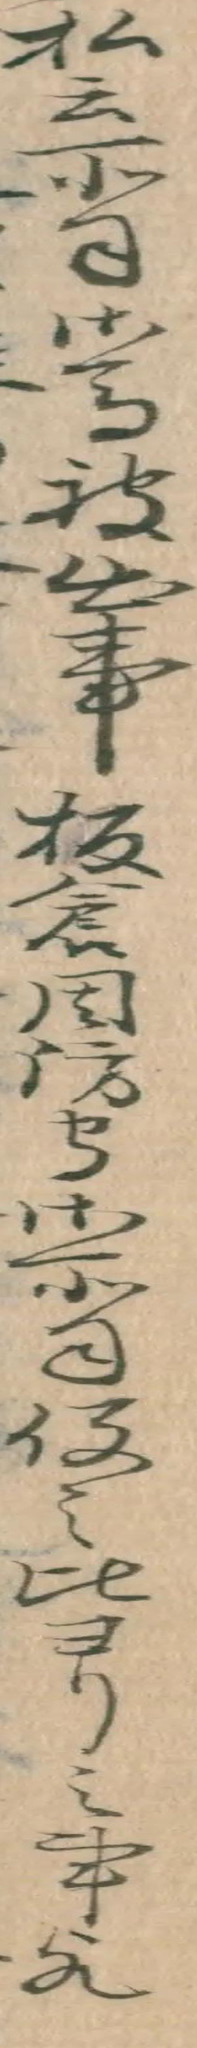私云所司御馬被出事板倉周防守御所司役之比ヨリ之事歟
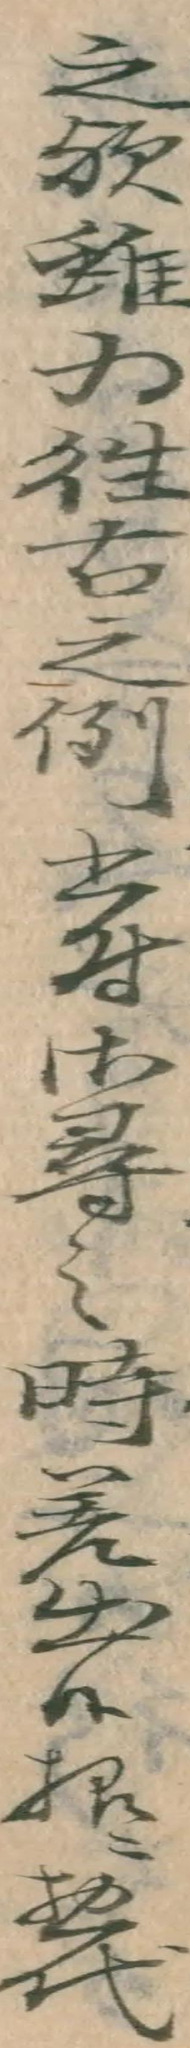之歟雖為往古之例書付御尋之時差出候様ニ惣代
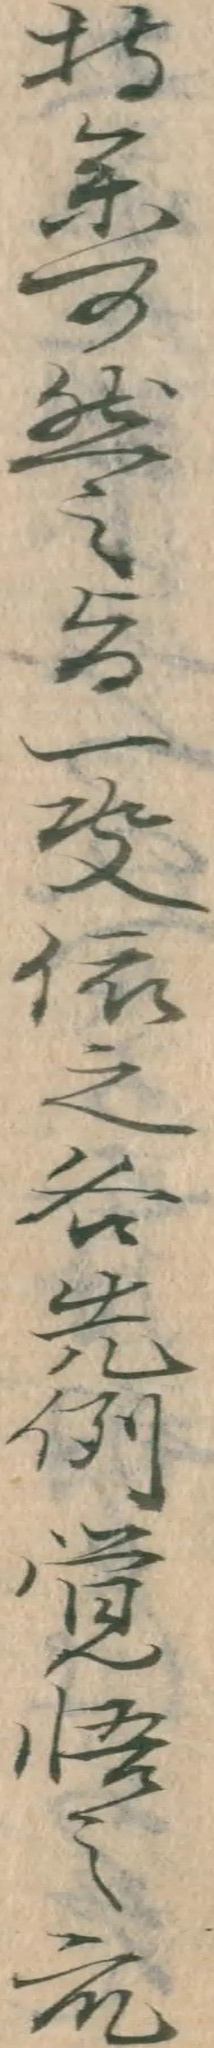持参可然之旨一決依之各先例覚悟之衆
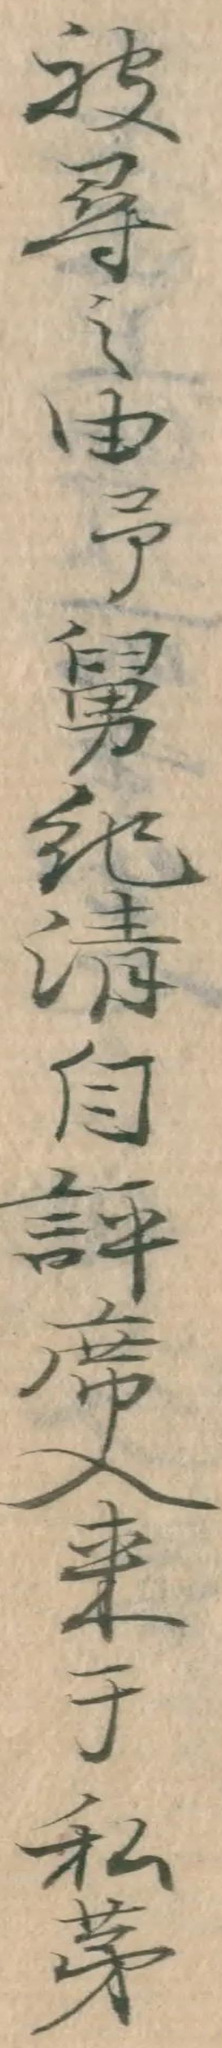被尋之由予舅紀清自評席入来于私芽
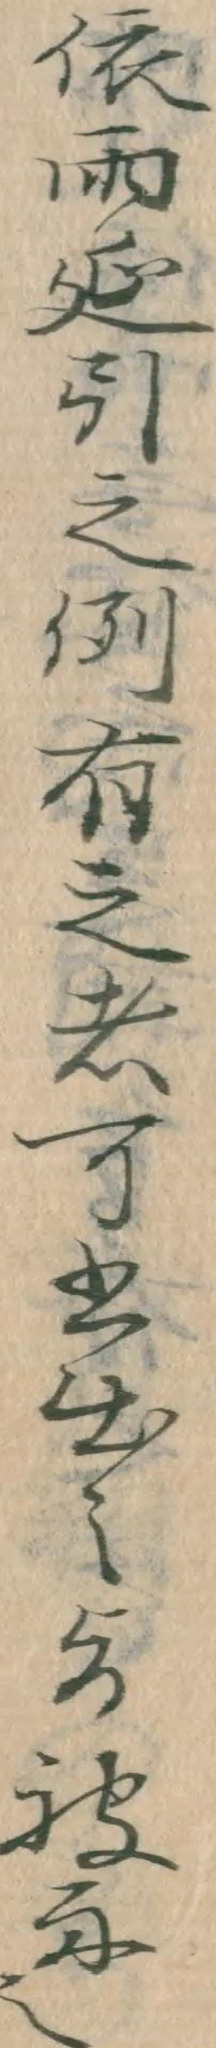依雨延引之例有之者可書出之旨被示之
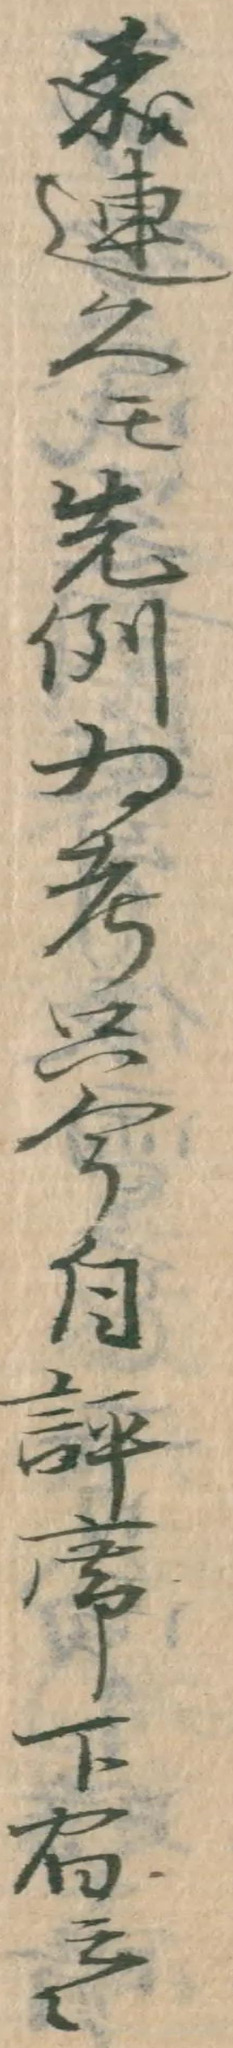成連久モ先例為考只今自評席下有云々
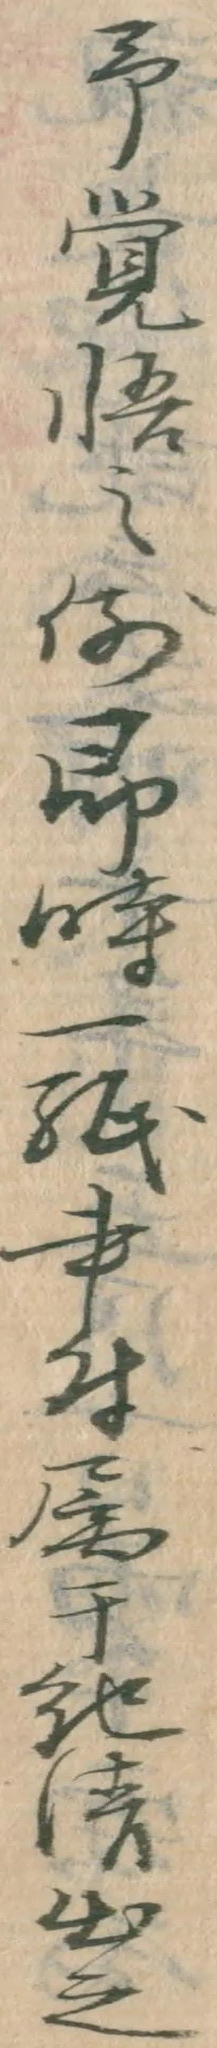予覚悟之例即時一紙書付属于紀清出之
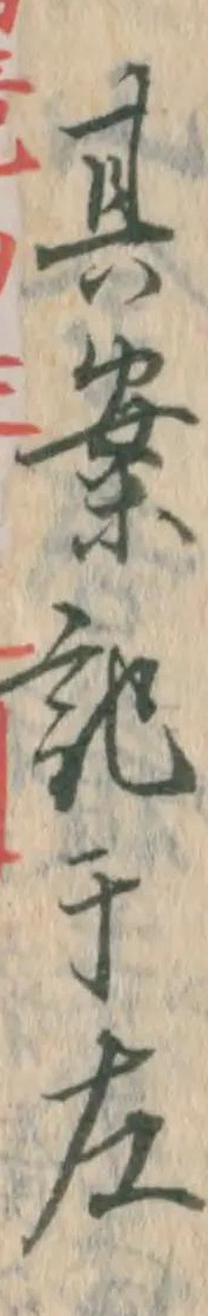其案記于左
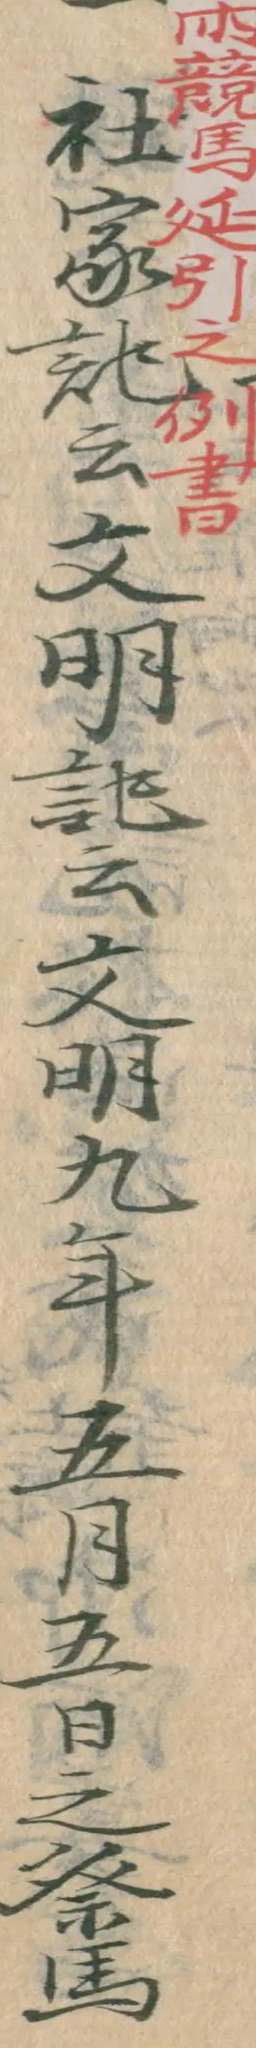一社家記云文明記云文明九年五月五日之祭馬
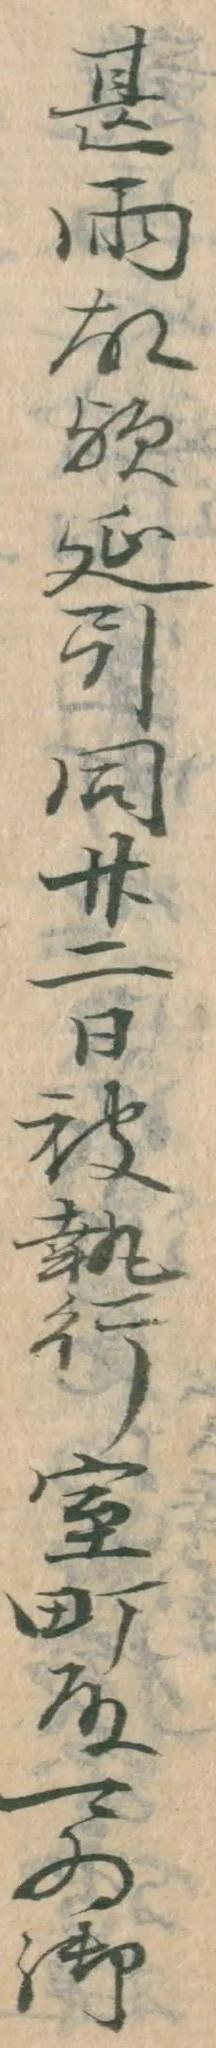甚雨故歟延引同廿二日被執行室町殿可為御
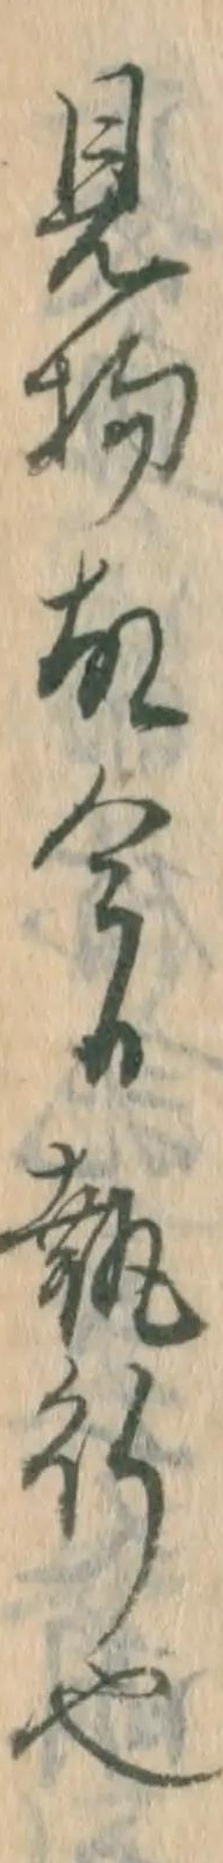見物故今日執行也
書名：賀茂社記録. 第10冊
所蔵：国立国会図書館 National Diet Library, JAPAN
